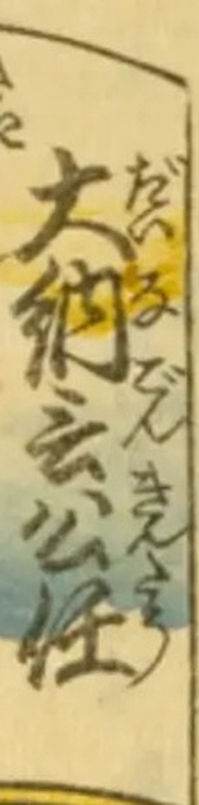大納言公任
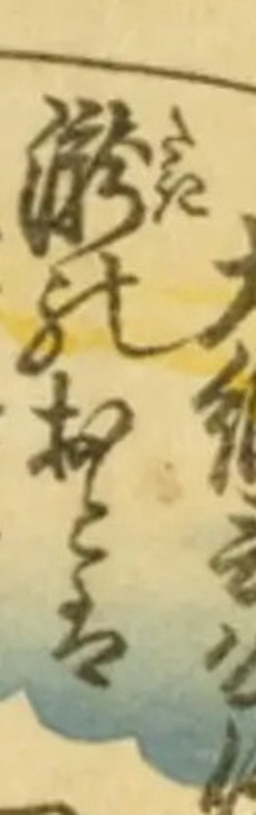瀧のおとは
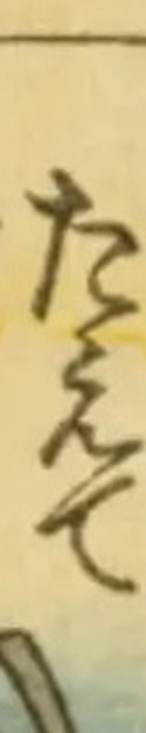たえて
